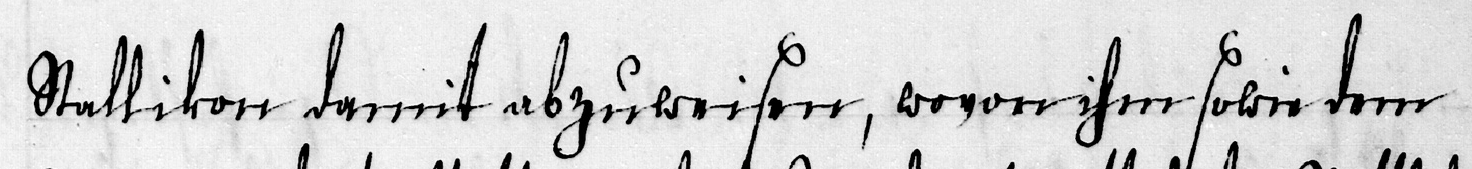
Stallikon damit abzuweisen, wovon ihm sowie dem
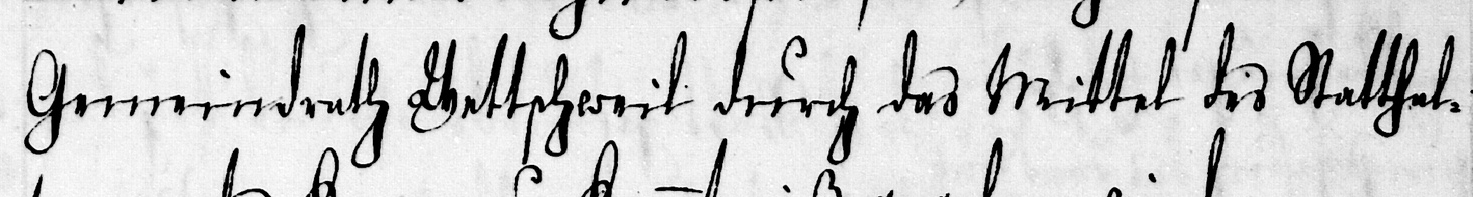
Gemeindrath Wettschweil durch das Mittel des Stattha¬
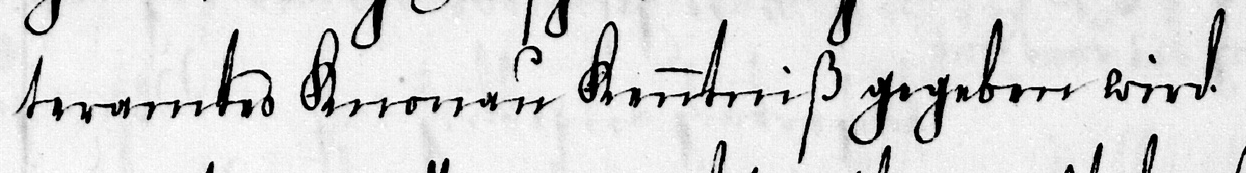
lteramtes Knonau Kenntniß gegeben wird.
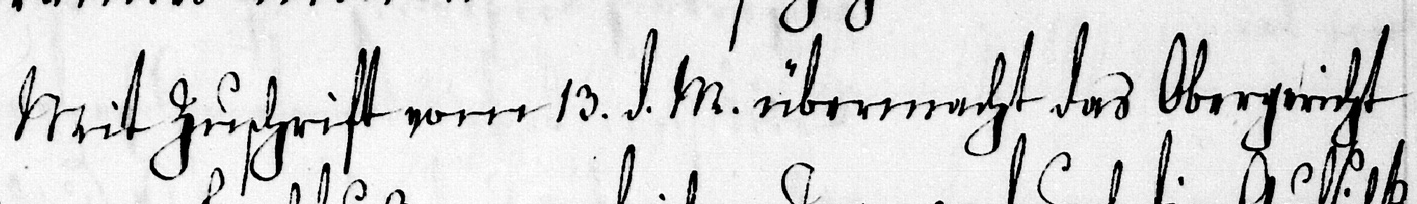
Mit Zuschrift vom 13. d. M. übermacht das Obergericht
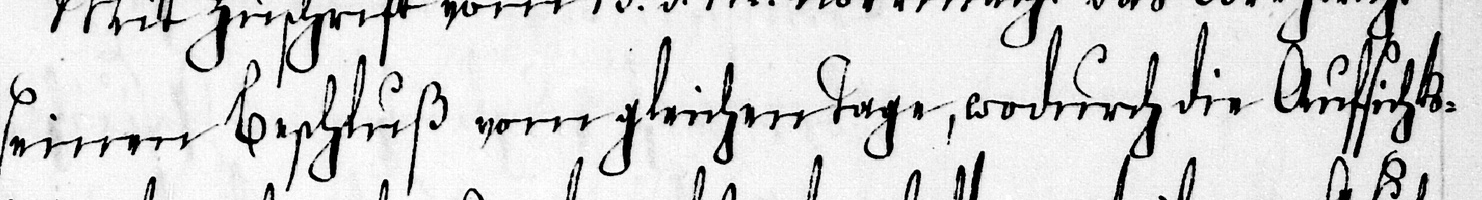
seinen Beschluß vom gleichen Tage, wodurch die Aufsicht¬
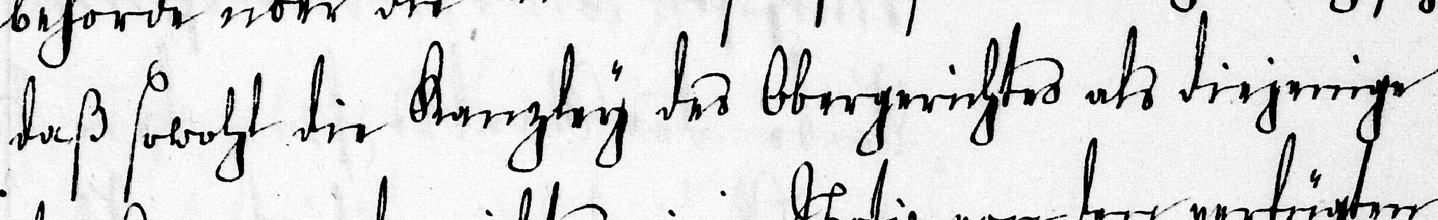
daß sowohl die Kanzley des Obergerichtes als diejenige
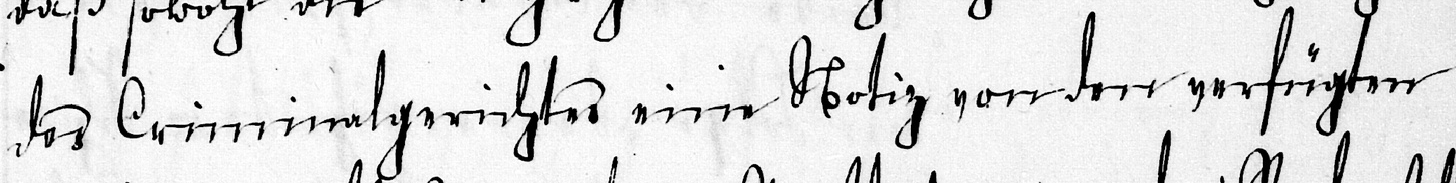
des Criminalgerichtes eine Notiz von den verfügten
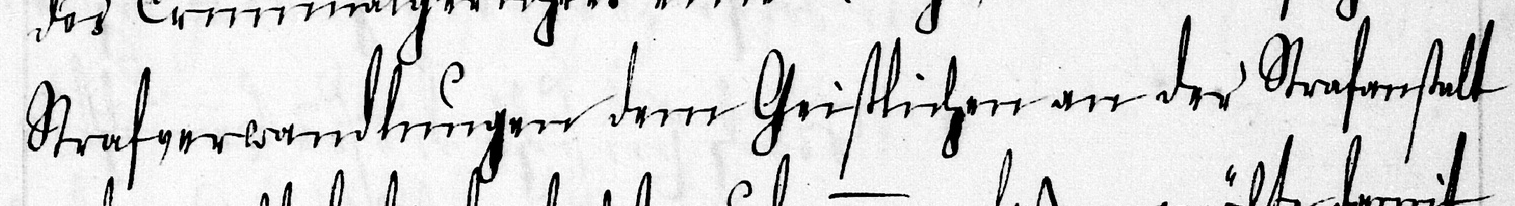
Strafverwandlungen dem Geistlichen an der Strafanstalt
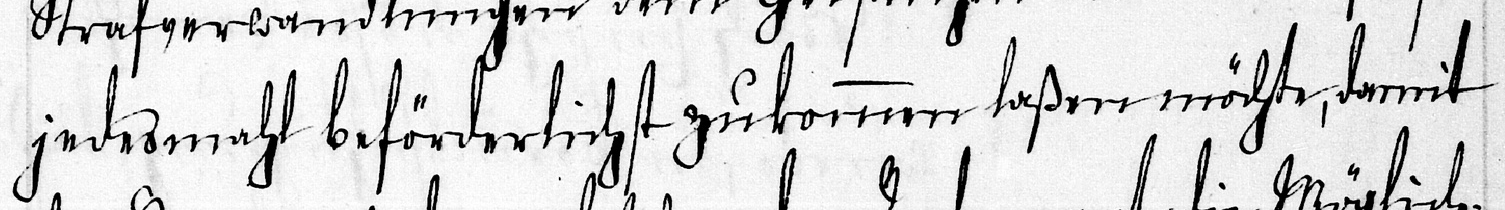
jedesmahl beförderlichst zukommen laßen möchte, damit
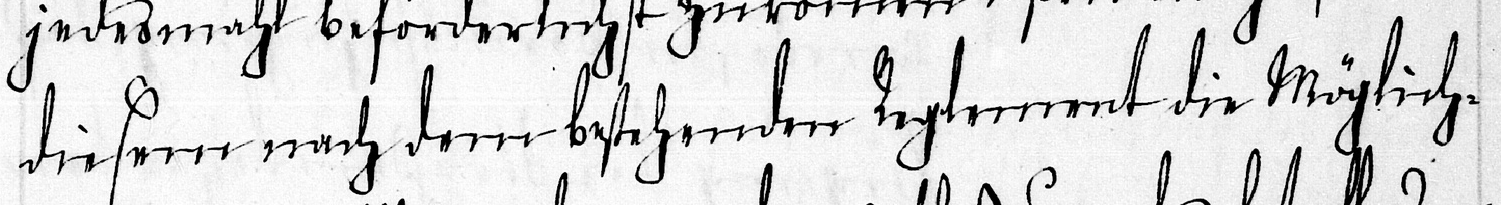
diesem nach dem bestehenden Reglement die Möglich¬
